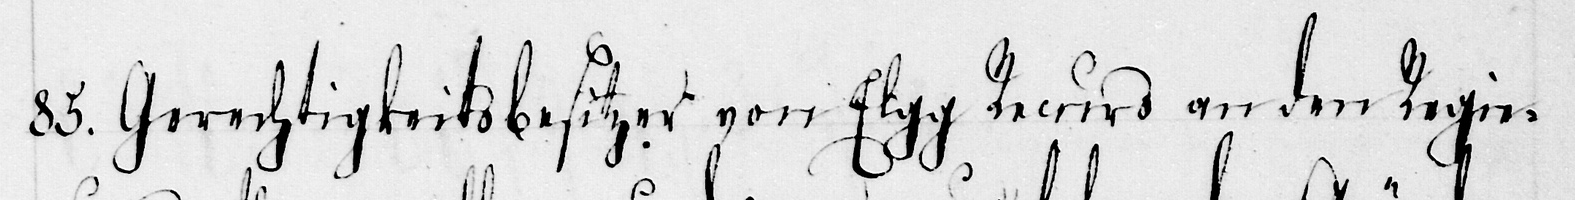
85. Gerechtigkeitsbesitzer von Elgg Recurs an den Regie¬
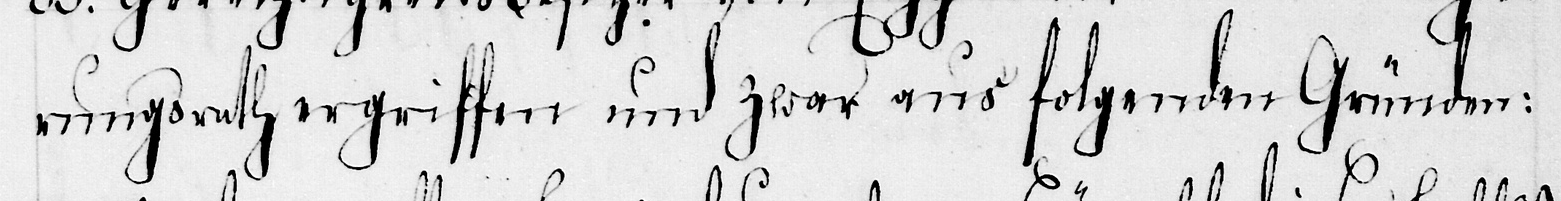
rungsrath ergriffen und zwar aus folgenden Gründen:
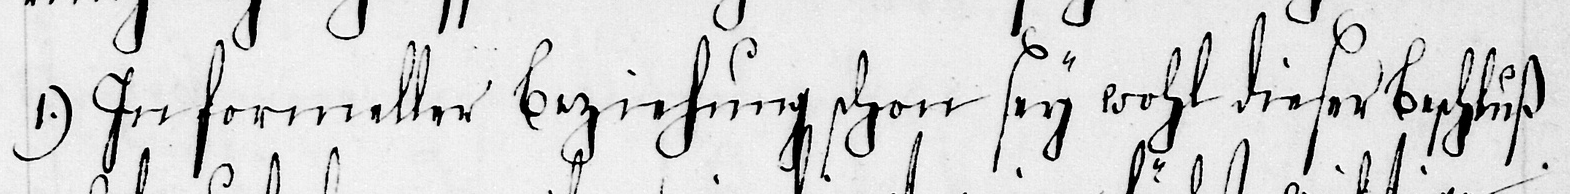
1.) In formeller Beziehung schon sey wohl dieser Beschluß
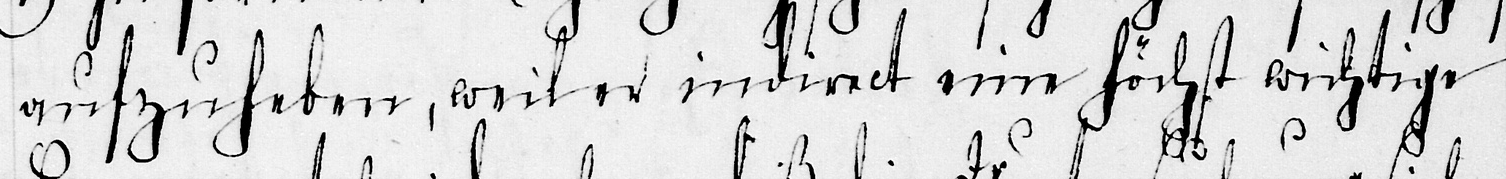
aufzuheben, weil er indirect eine höchst wichtige
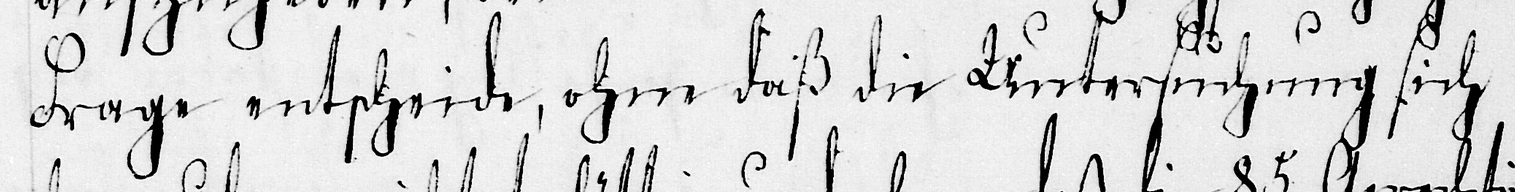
Frage entscheide, ohne daß die Untersuchung sich
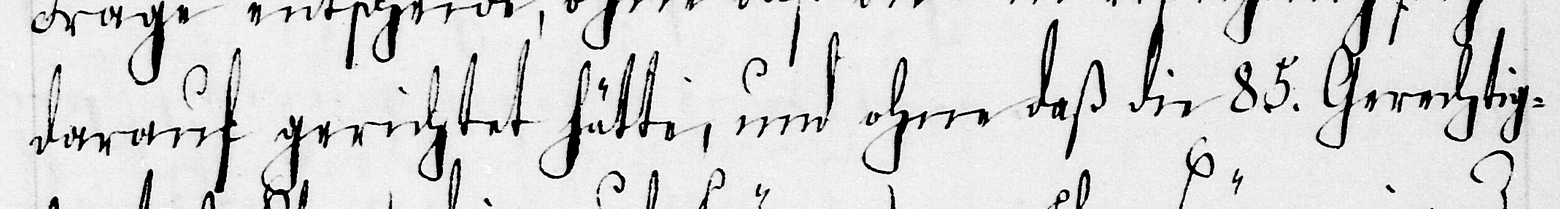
darauf gerichtet hätte, und ohne daß die 85. Gerechtig¬
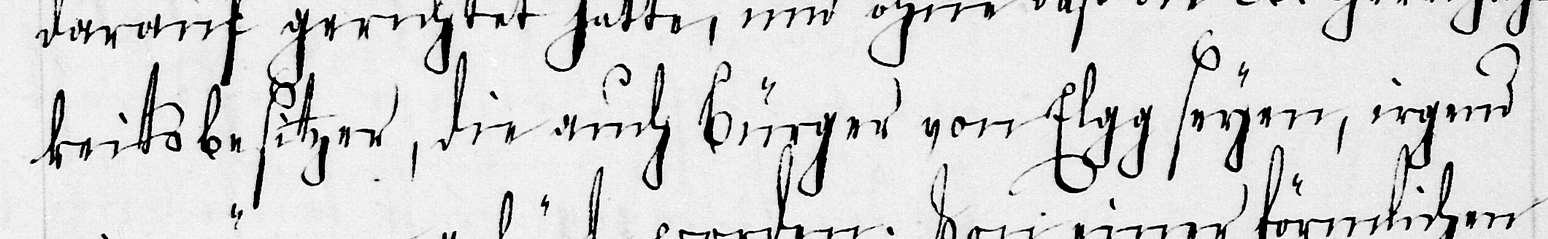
keitsbesitzer, die auch Bürger von Elgg seyen, irgend
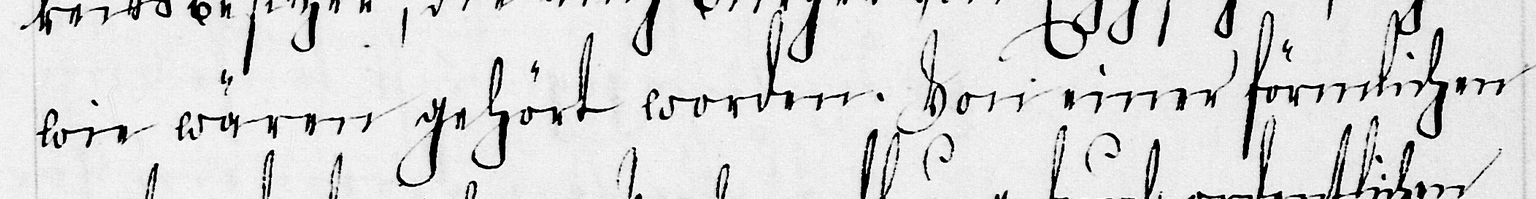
wie wären gehört worden. Von einer förmlichen
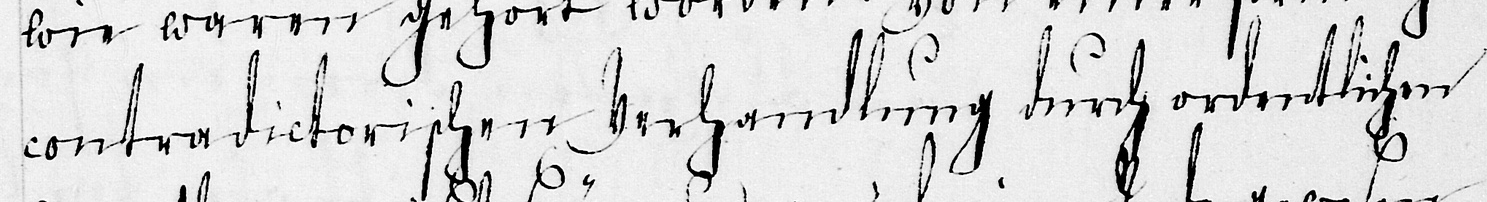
contradictorischen Verhandlung durch ordentlichen
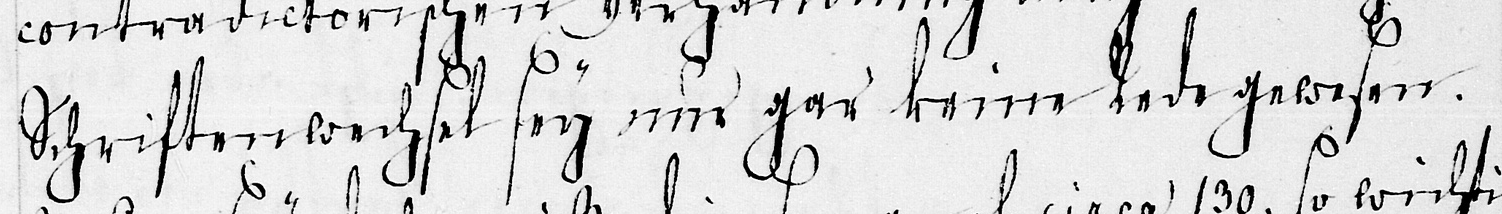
Schriftenwechsel sey nur gar keine Rede gewesen.
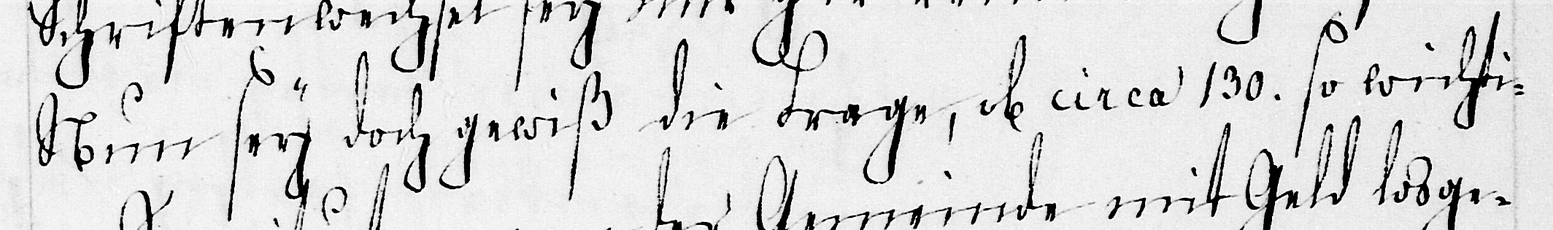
Nun sey doch gewiß die Frage, ob circa 130. so wichti¬
